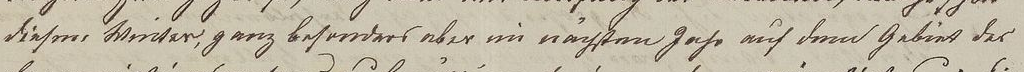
diesen Winter, ganz besonders aber im nächsten Jahr auf dem Gebiet des
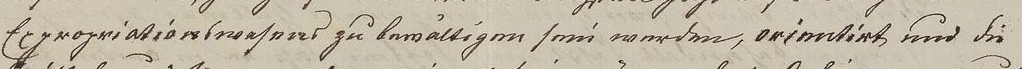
Expropriationswesens zu bewältigen sein werden, orientirt und die
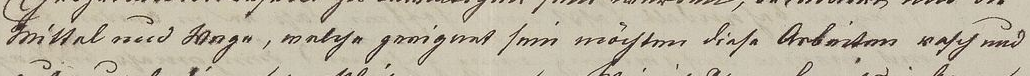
Mittel und Wege, welche geeignet sein möchten diese Arbeiten rasch und
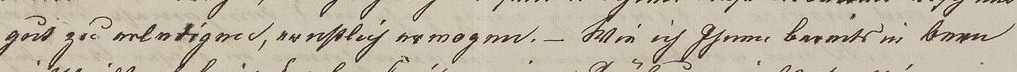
gut zu erledigen, ernstlich erwogen. – Wie ich Ihnen bereits in Bern
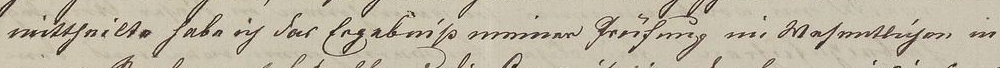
mittheilte habe ich das Ergebniß meiner Prüfung im Wesentlichen in
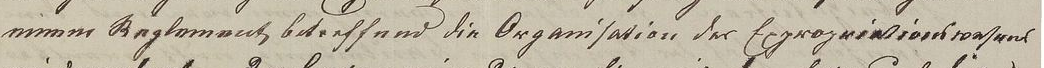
einem Reglement betreffend die Organisation des Expropriationswesens
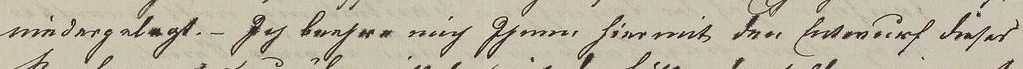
niedergelegt. – Ich beehre mich Ihnen hiermit den Entwurf dieses
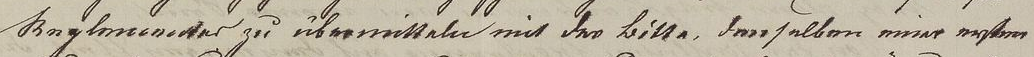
Reglementes zu übermitteln mit der Bitte, denselben einer ersten
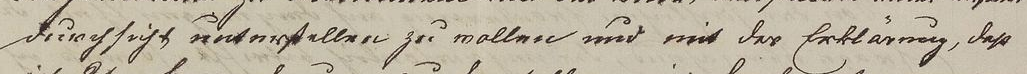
Durchsicht unterstellen zu wollen und mit der Erklärung, daß
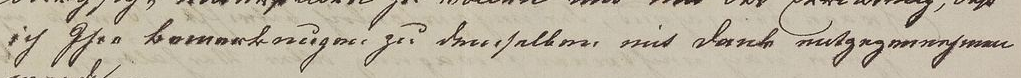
ich Ihre Bemerkungen zu demselben mit Dank entgegennehmen
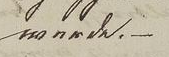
werde. –
